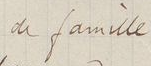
de famille,
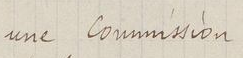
une Commission
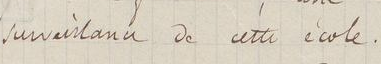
surveillance de cette école.
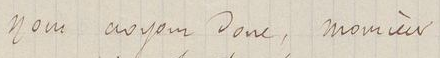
Nous croyons donc, Monsieur le
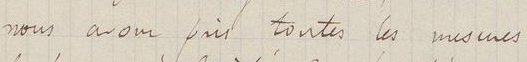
nous avons pris toutes les mesures nécessaires
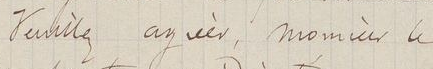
Veuillez agréer, Monsieur le
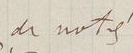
de notre
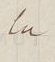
haute
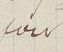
considération.
